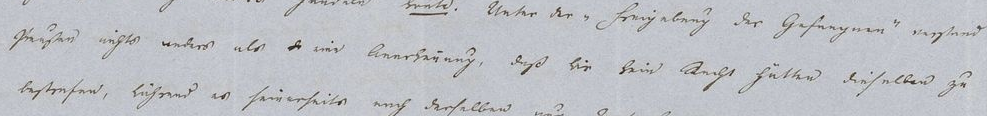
Preußen nichts anders als d eine Anerkennung, daß wir kein Recht hätten dieselben zu
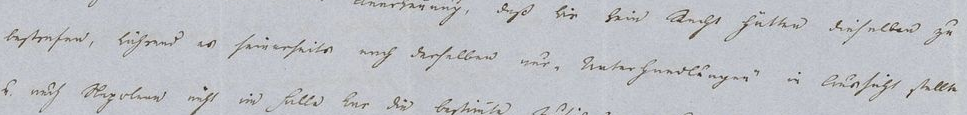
bestrafen, während es seinerseits nach derselben nur «Unterhandlungen» in Aussicht stellte
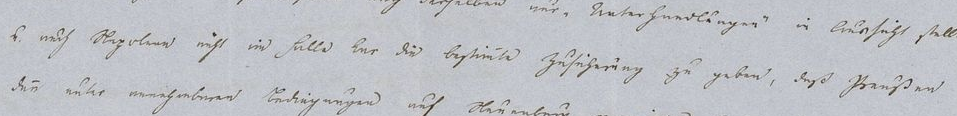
u. auch Napoleon nicht im Falle war die bestimmte Zusicherung zu geben, daß Preußen
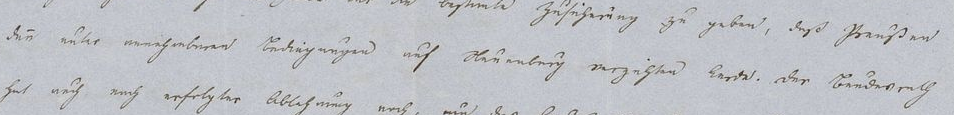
dann unter annehmbaren Bedingungen auf Neuenburg verzichten werde. Der Bundesrath
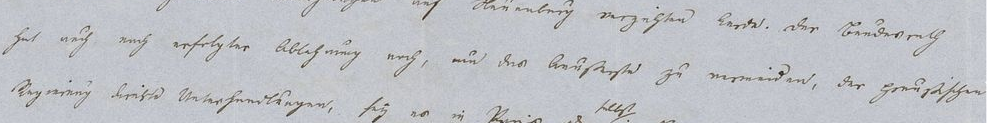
hat auch nach erfolgter Ablehnung noch, um das Aeußerste zu vermeiden, der preußischen
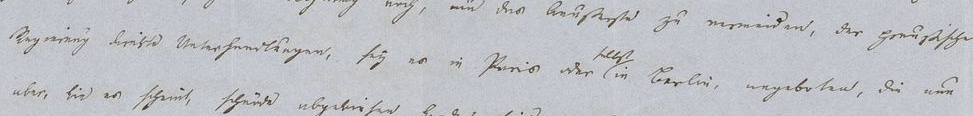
Regierung direkte Unterhandlungen, sey es in Paris oder selbst in Berlin, angeboten, die nun
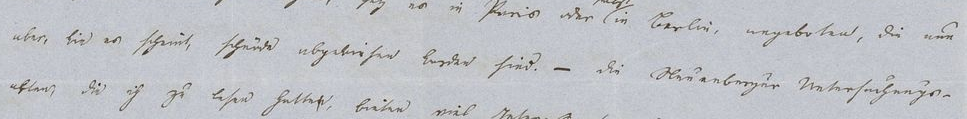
aber, wie es scheint, schnöde abgewiesen worden sind. – Die Neuenburger Untersuchungs-
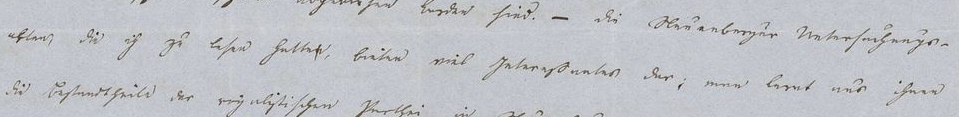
akten, die ich zu lesen hatte, bieten viel Interessantes dar; man lernt aus ihnen
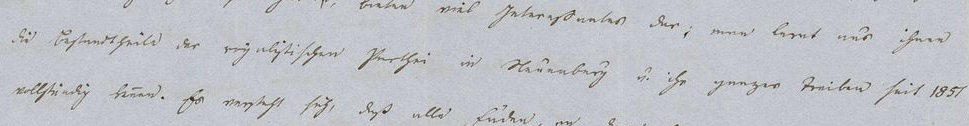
die Bestandtheile der royalistischen Parthei in Neuenburg u. ihr ganzes Treiben seit 1851
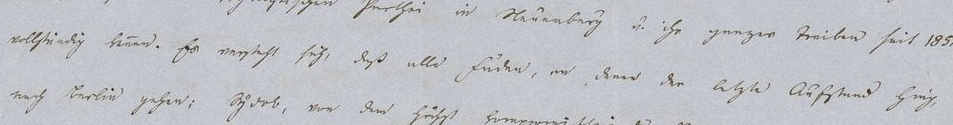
vollständig kennen. Es versteht sich, daß alle Fäden, an denen der letzte Aufstand hing,
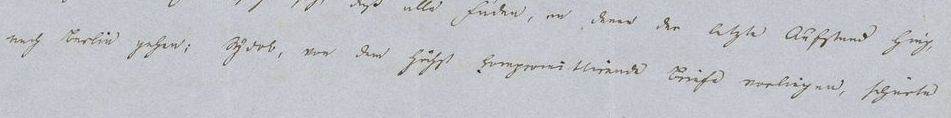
nach Berlin gehen; Sydow, von dem höchst kompromittirende Briefe vorliegen, schürte
